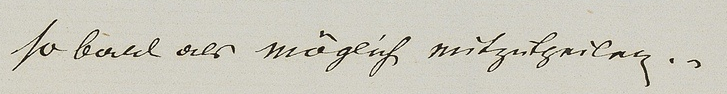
so bald als möglich mitzutheilen. –
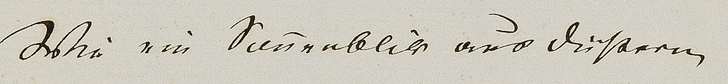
Wie ein Sonnenblik aus düsterm
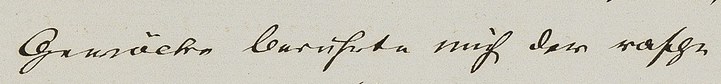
Gewölke berührte mich der rasche
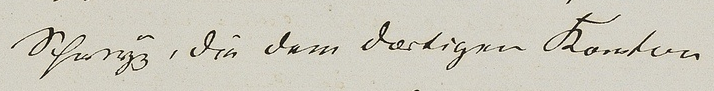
Schwyz, die dem dortigen Kanton
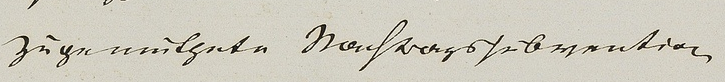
zugemuthete Nachtragssubvention
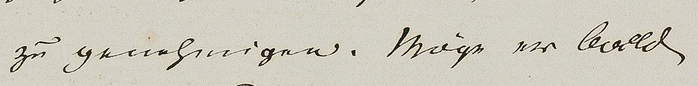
zu genehmigen. Möge er bald
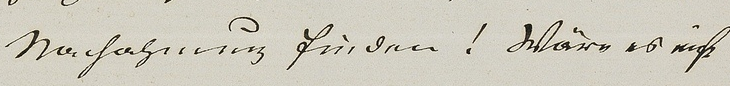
Nachahmung finden! Wäre es nicht
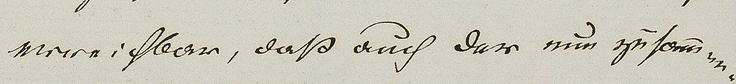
erreichbar, daß auch der zusammen-
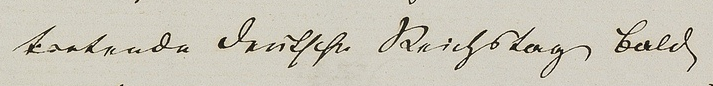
tretende deutsche Reichstag bald
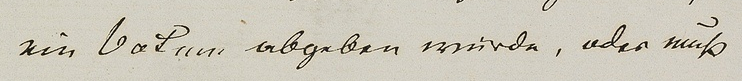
ein Votum abgeben würde, oder muß
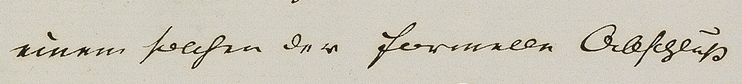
einem solchen der formelle Abschluß
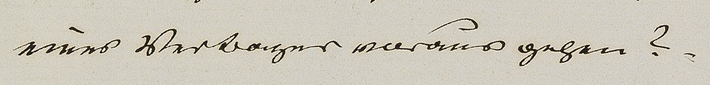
eines Vertrages vorausgehen? –
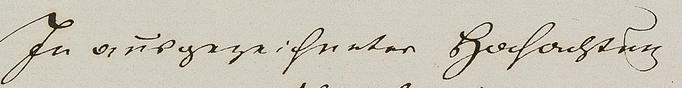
In ausgezeichneter Hochachtung
